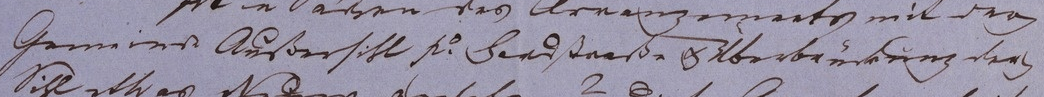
Gemeinde Außersihl po Hardstraße & Überbrückung der
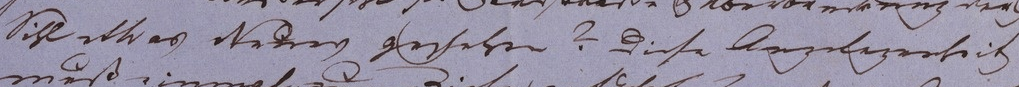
Sihl etwas Neues geschehen? Diese Angelegenheit
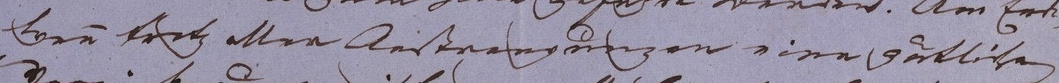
wenn trotz aller Anstrengungen eine gütliche
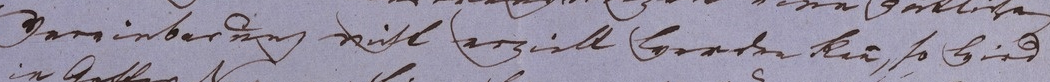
Vereinbarung nicht erzielt werden kann, so wird
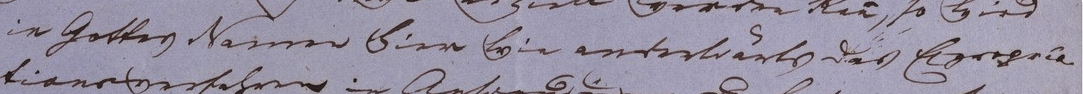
in Gottes Namen hier wie anderwärts das Expropria-
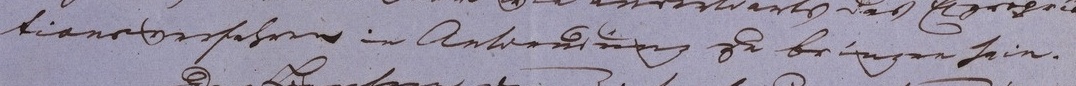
tionsverfahren in Anwendung zu bringen sein.
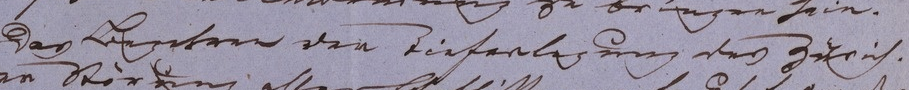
Das Begehren der Tieferlegung des Zürich-
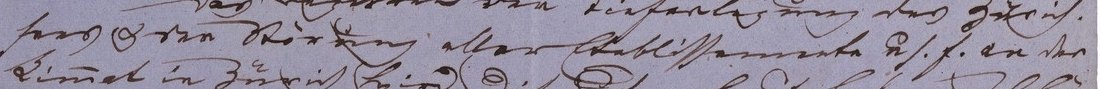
sees & der Störung aller Etablissemente us. f. an der
